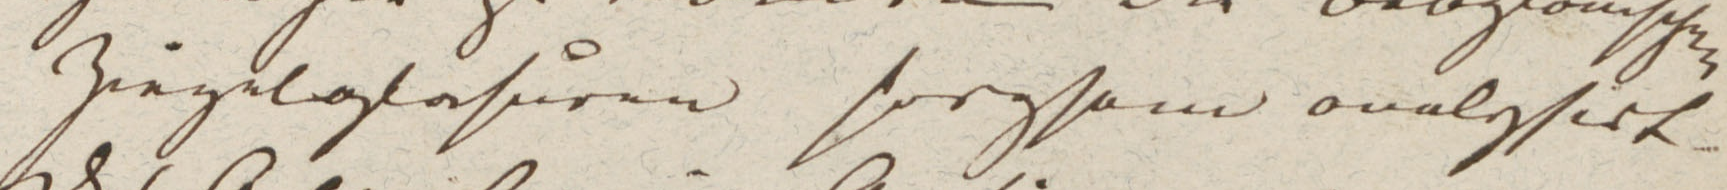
Ziegelglasuren sorgsam analysirt.
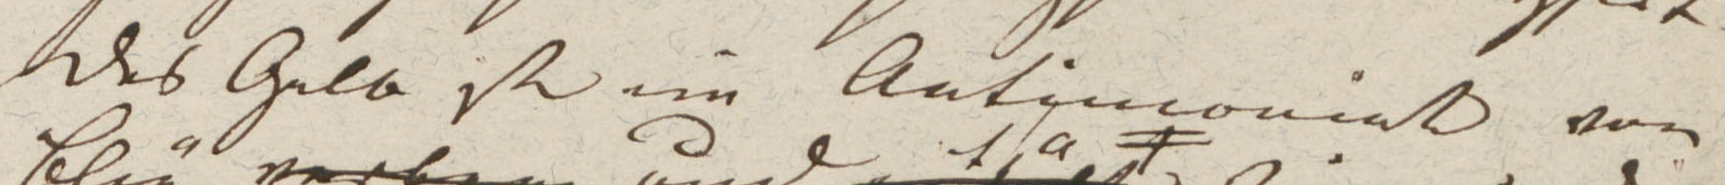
Das Gelb ist ein Antimoniat von
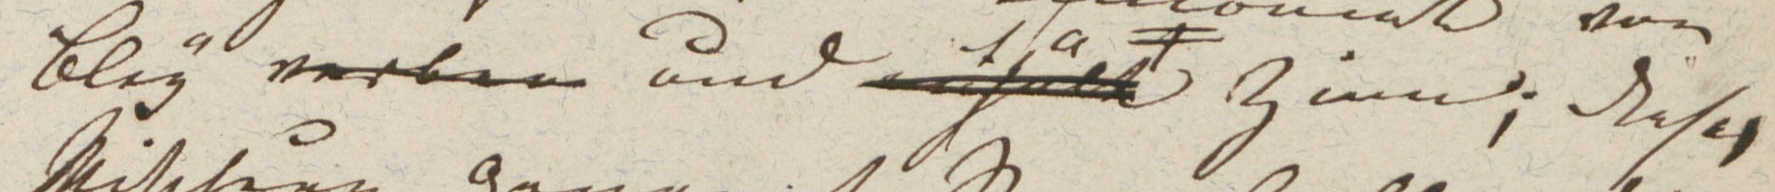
Bley v und enthält % Zinn; iese
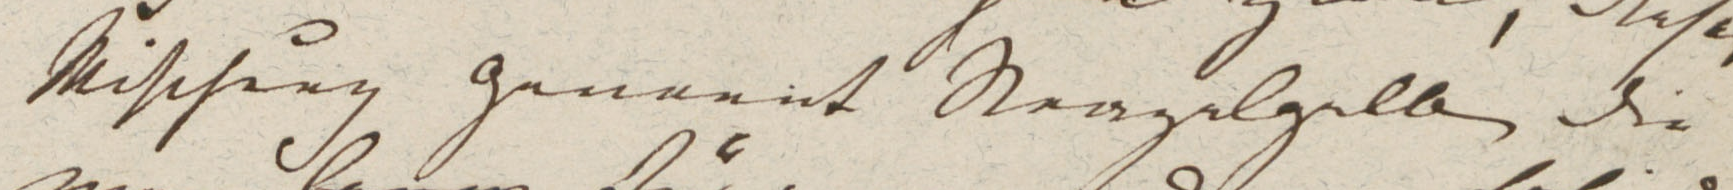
Mischung genannt Neapelgelb die
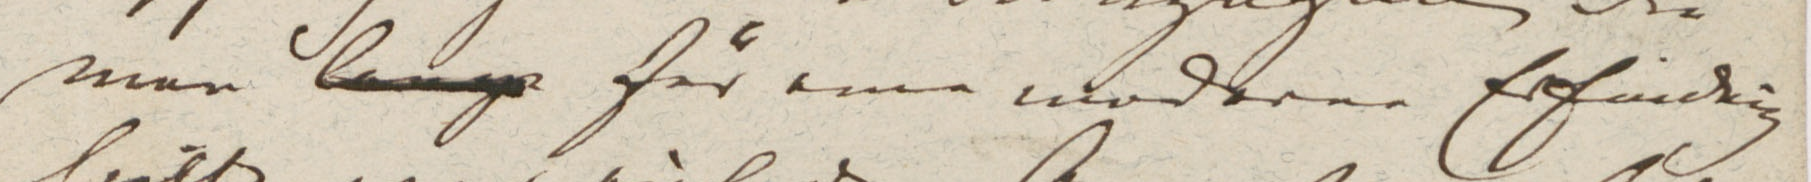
man lange für eine moderne Erfindung
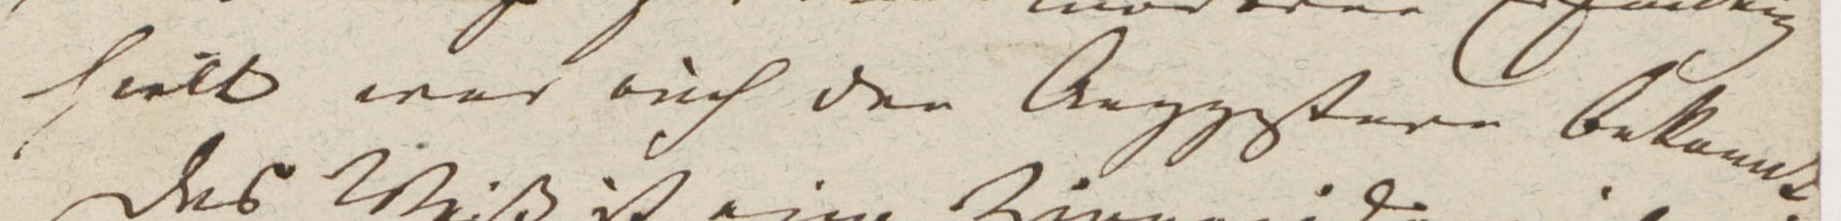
hielt war auch den Aegyptern bekannt.
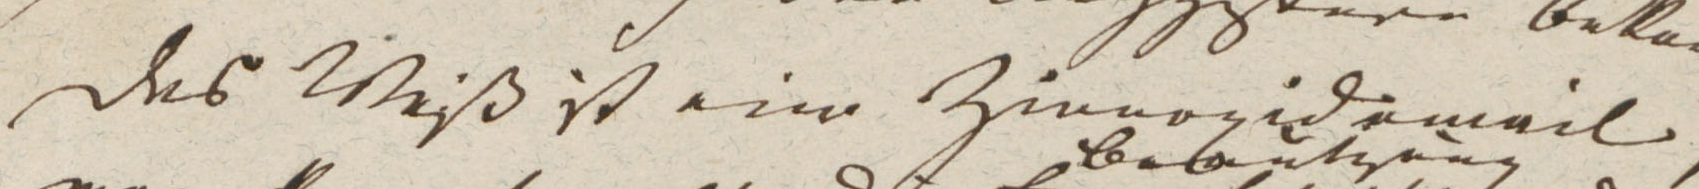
Das Weiss ist eine Zinnoxidemail,
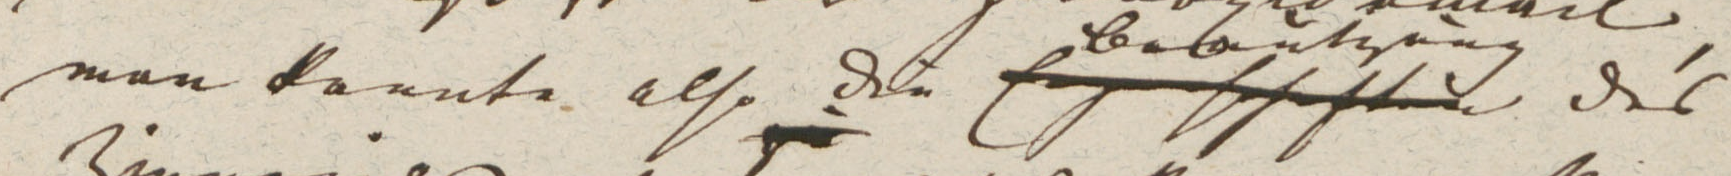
man kannte also die Eigenschaften Bentzung des
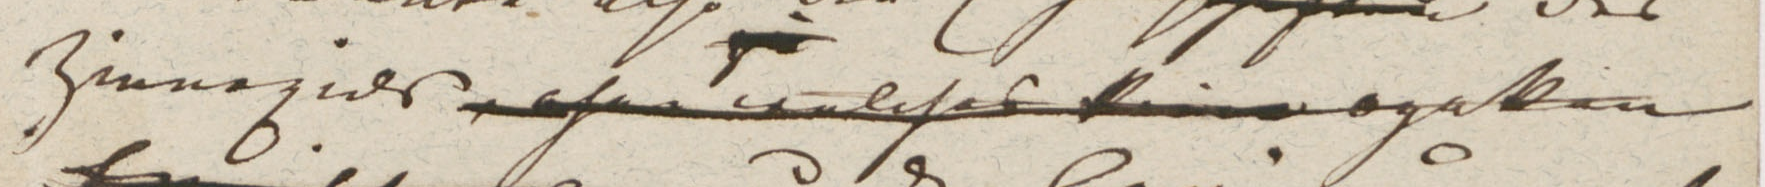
Zinnoxids, ohne welches keine opaken
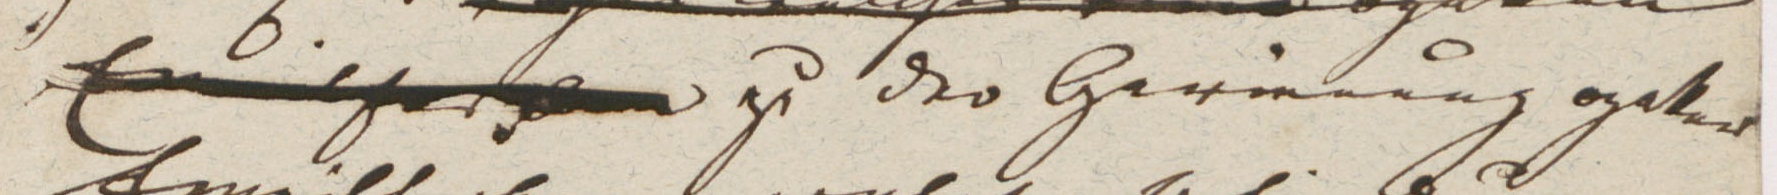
Emailfarben zu der Gewinnung opaker
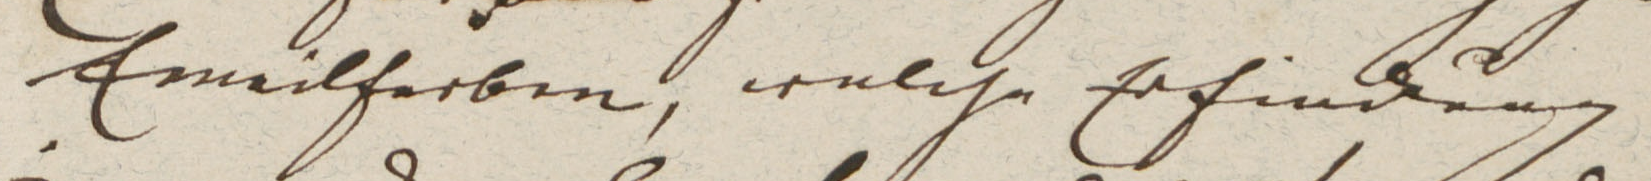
Emailfarben, welche Erfindung
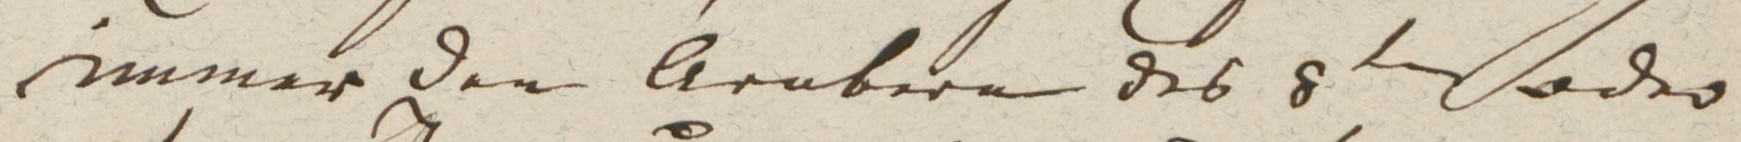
immer den Arabern des 8ten oder
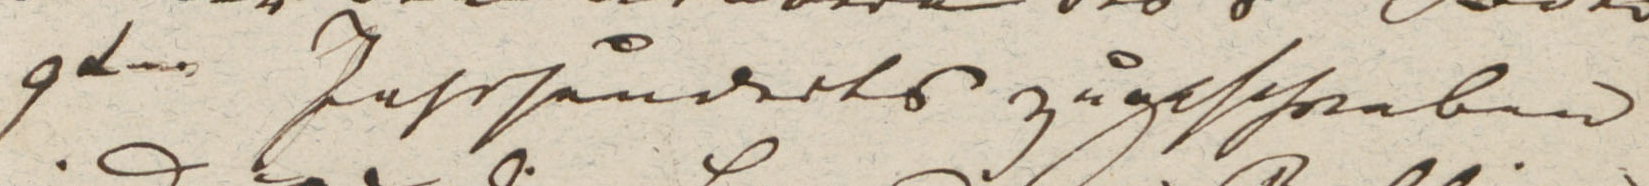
9ten Jahrhunderts zugeschrieben
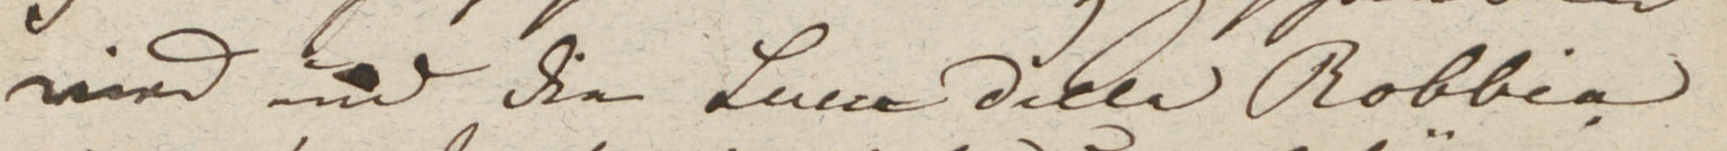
wird und die Lucca della Robbia
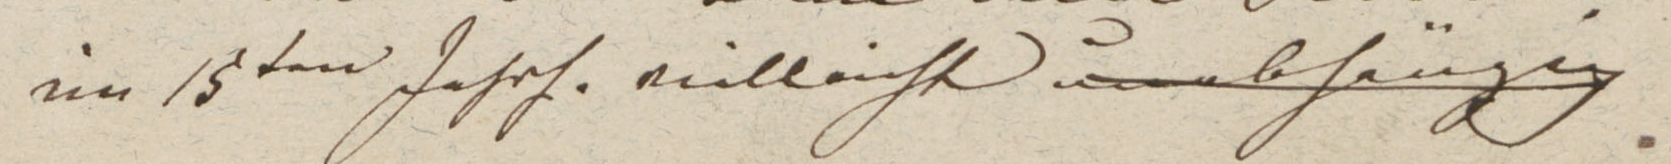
im 15ten Jahrh. vielleicht unabhängig
